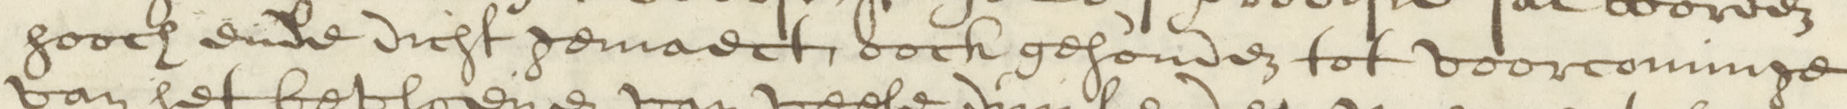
hooch ende dicht gemaect, oock gehouden tot voorcominge
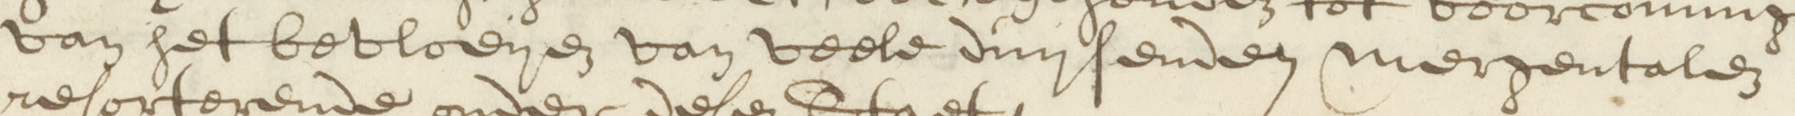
van het bevloeijen van veele duijsenden mergentalen
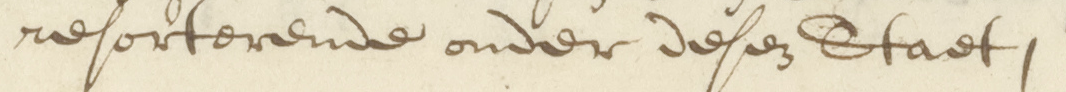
resorterende onder desen Staet.
